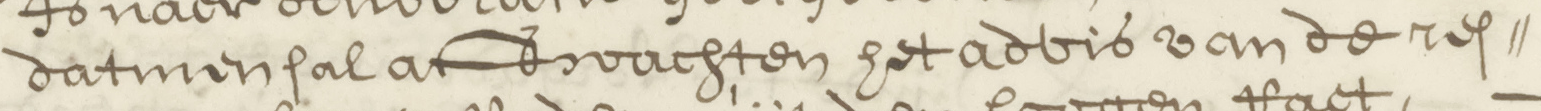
datmen sal affwachten het advis van de res„
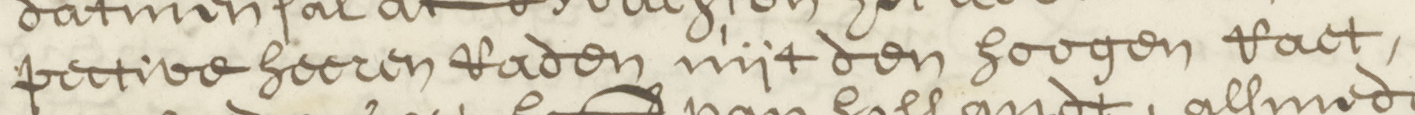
pective heeren Raden uijt den hoogen Raet,
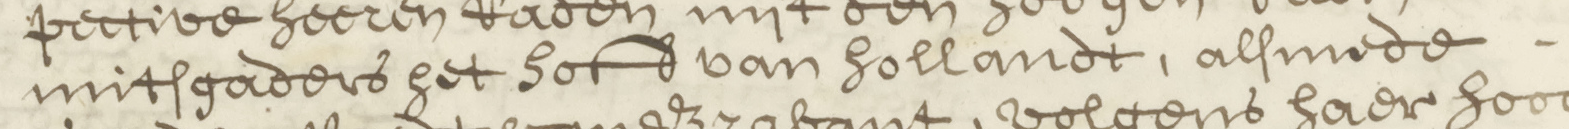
mitsgaders het hoff van hollandt, alsmede -
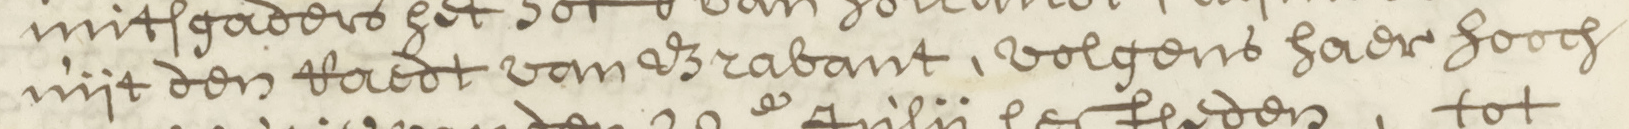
uijt den Raedt van Brabant, volgens haer hooch
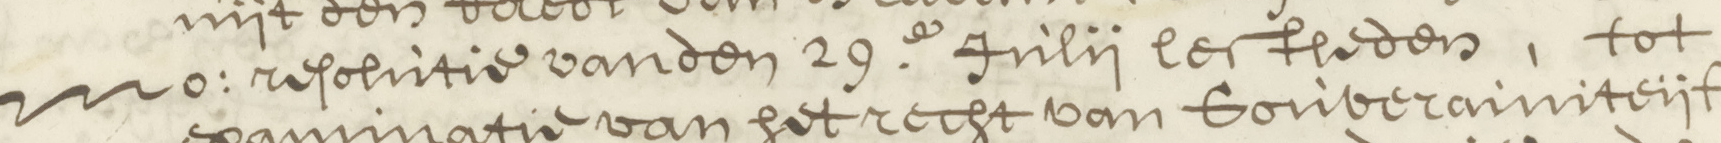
Mo: resolutie van den 29e. Julij lestleden, tot
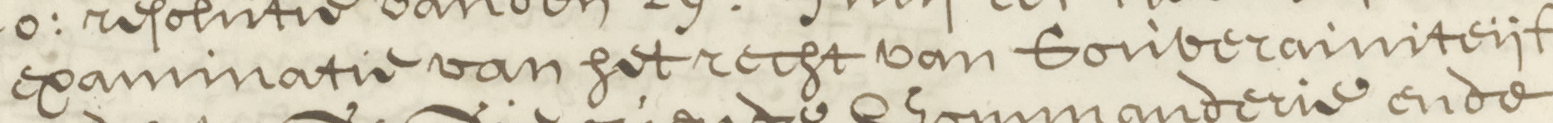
examinatie van het recht van Souverainiteijt
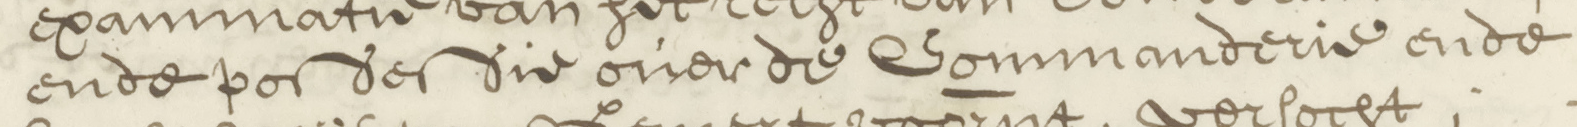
ende possessie ouer de Commanderie ende
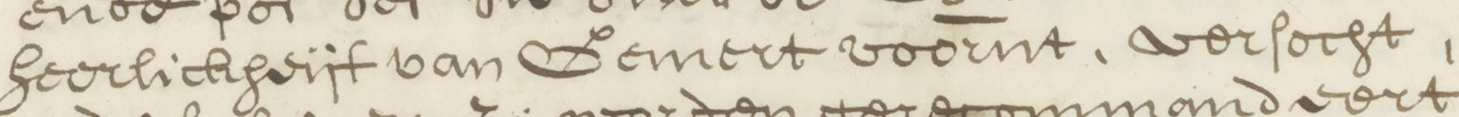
heerlickheijt van Gemert voornt, versocht,
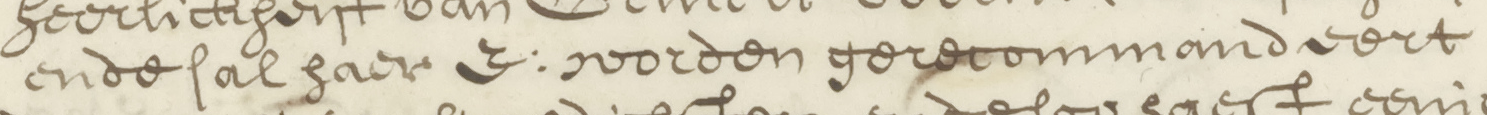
ende sal haer E: worden gerecommandeert
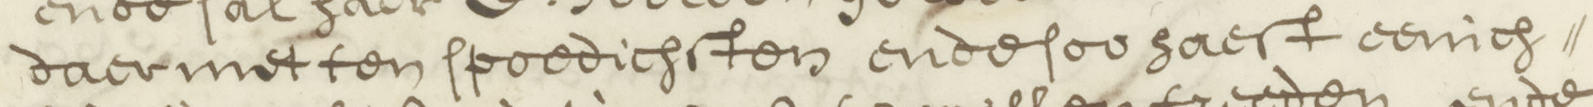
daer met ten spoedichsten ende soo haest eenich„
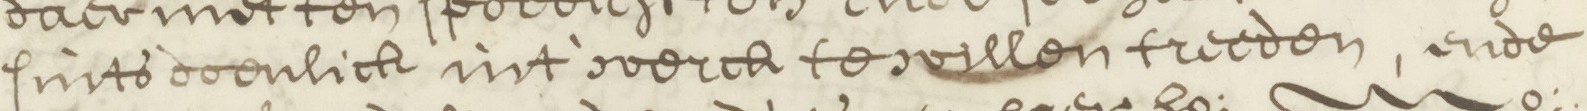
sints doenlick int' werck te willen treeden, ende
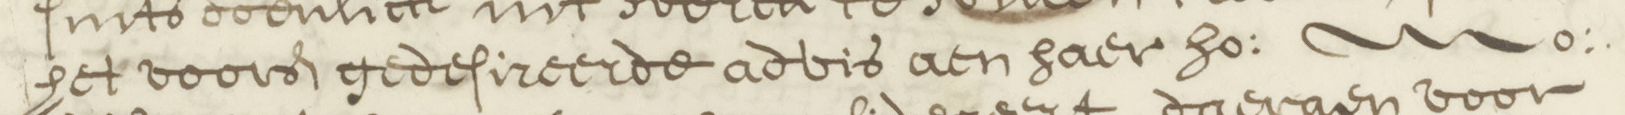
het voors gedesireerde advis aen haer ho:Mo:
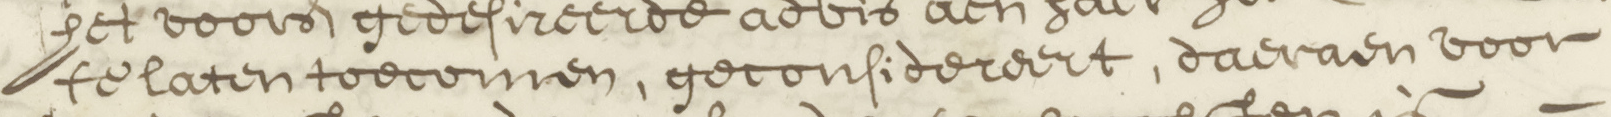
te laten toecomen, geconsidereert, daeraen voor
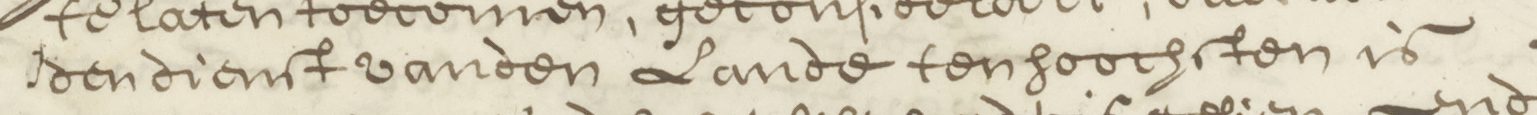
den dienst vanden Lande ten hoochsten is
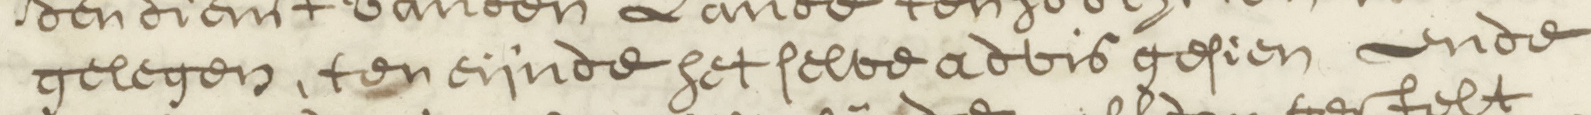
gelegen, ten eijnde het selve advis gesien ende
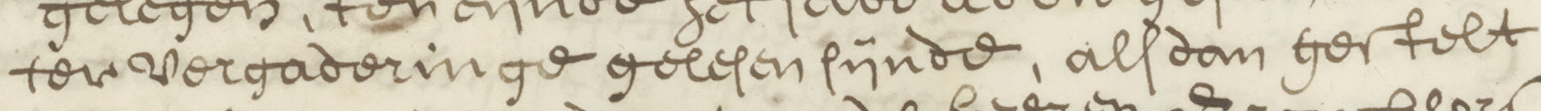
ter Vergaderinge gelesen sijnde, alsdan gestelt
